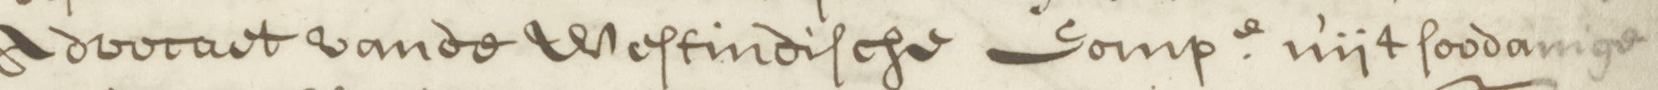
Advocaet vande Westindische Compe. uijt soodanige
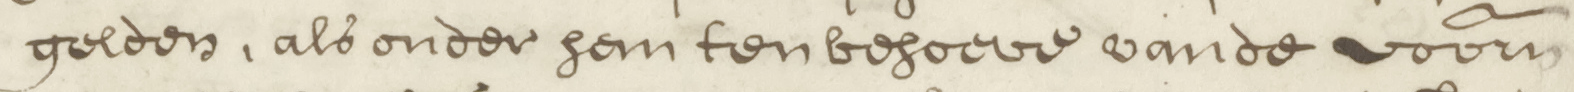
gelden, als onder hem ten behoeve vande voorn.
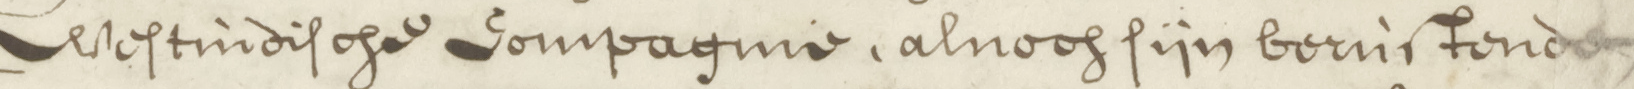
Westindische Compagnie, alnoch sijn berustende
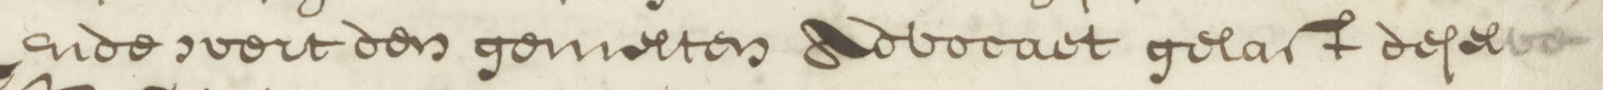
ende wort den gemelten Advocaet gelast deselve
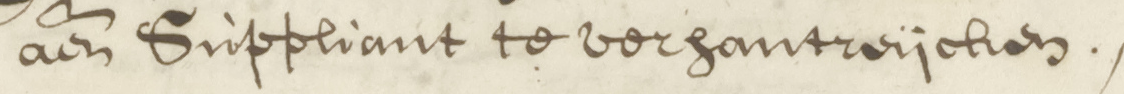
aen Suppliant te verhantreijcken.
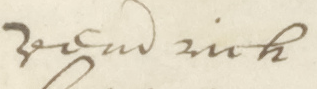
Vendrick
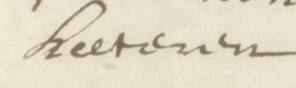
Heeteren
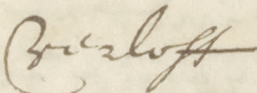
Verloff
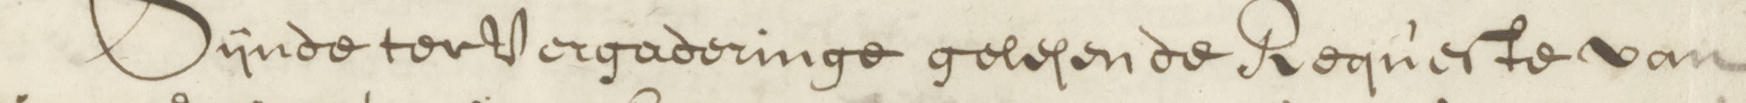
Sijnde ter Vergaderinge gelesen de Requeste van
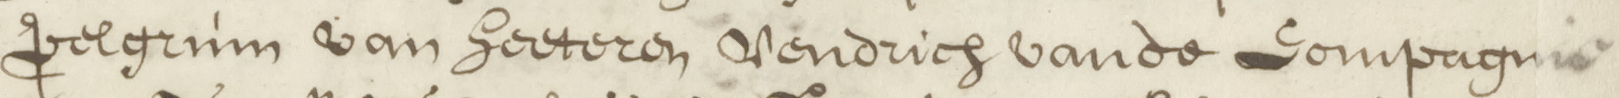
Pelgrum van Heeteren Vendrich vande Compagnie
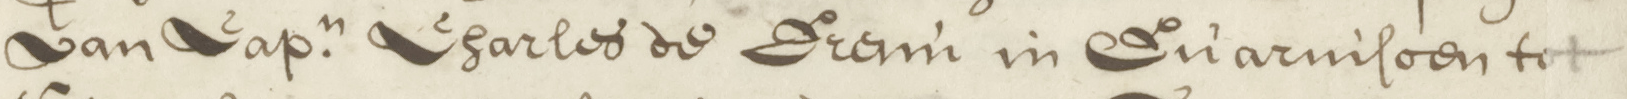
van Capn. Charles de Grenu in Guarnisoen tot
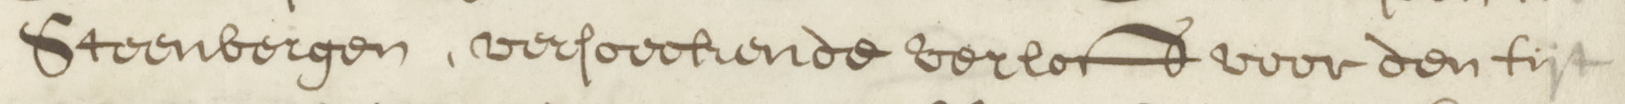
Steenbergen, versoeckende verloff voor den tijt
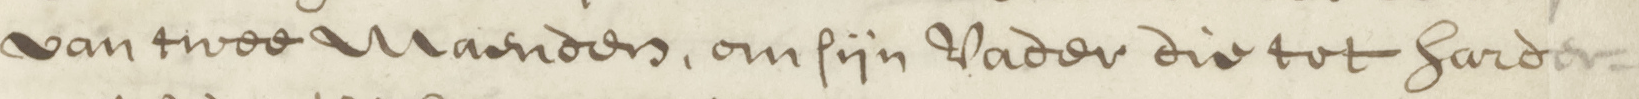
van twee Maenden, om sijn Vader die tot harder„
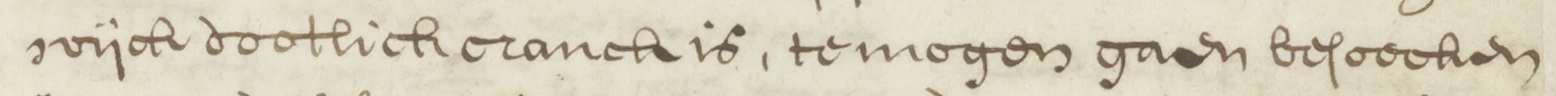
wijck dootlick cranck is, te mogen gaen besoecken;
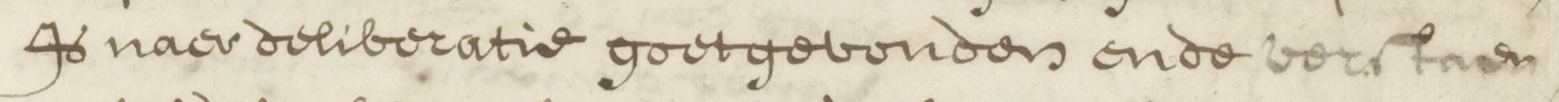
Is naer deliberatie goetgevonden ende verstaen,
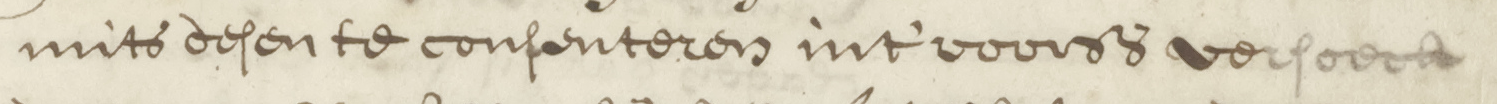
mits desen te consenteren int' voors versoeck,
